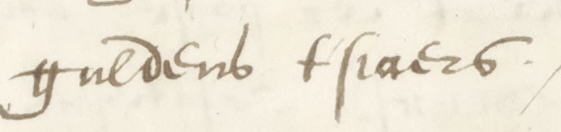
guldens t'siaers.
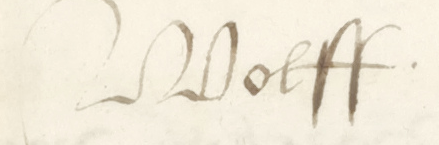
Wolff
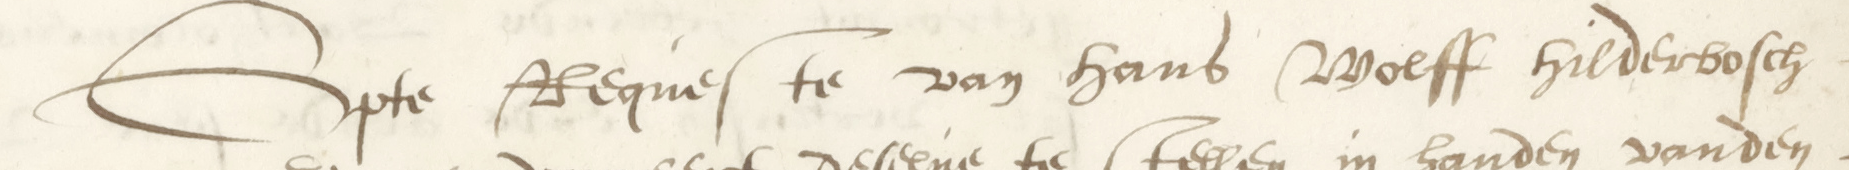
Opte Requeste van Hans Wolff Hilderbosch
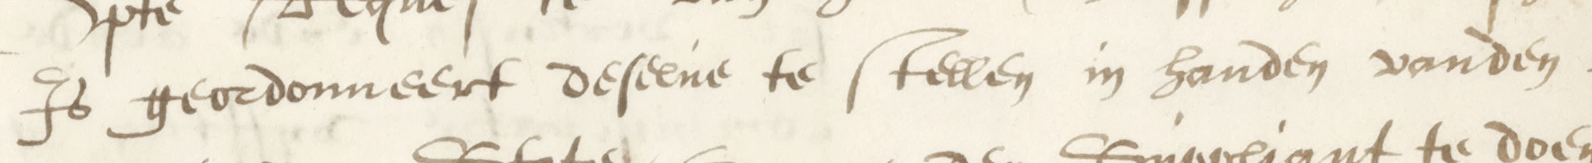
Is geordonneert deselue te stellen in handen vanden
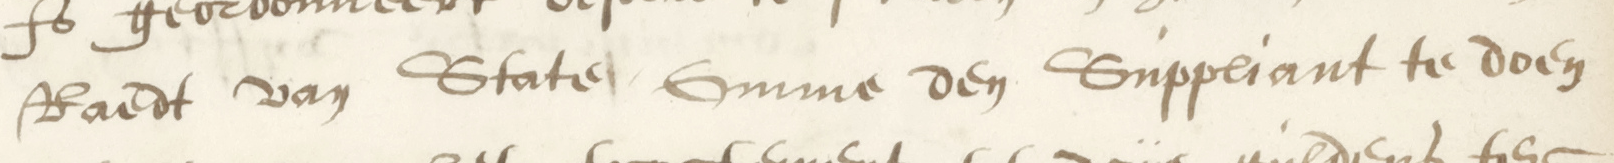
Raedt van State omme den Suppliant te doen
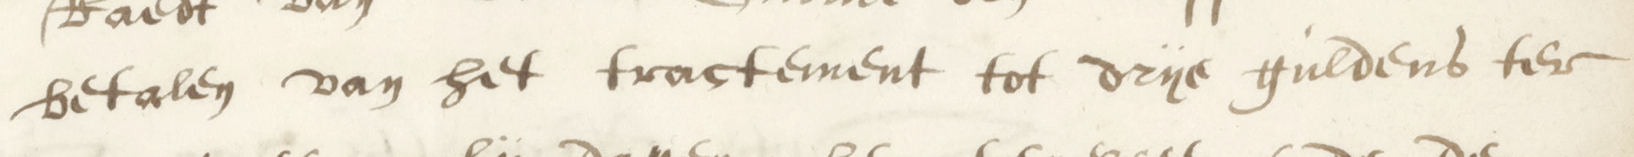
betalen van het tractement tot drije guldens ter
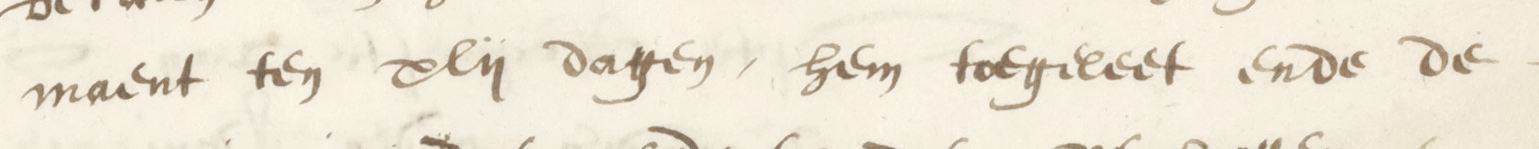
maent ten xlij dagen, hem toegeleet ende de
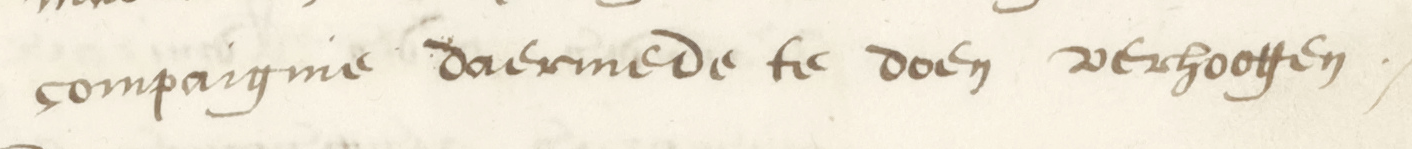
compaignie daermede te doen verhoogen.
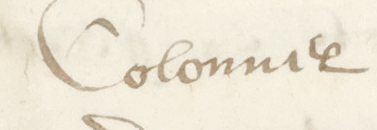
Colonnel
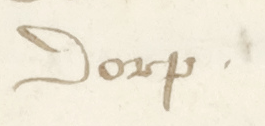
Dorp.
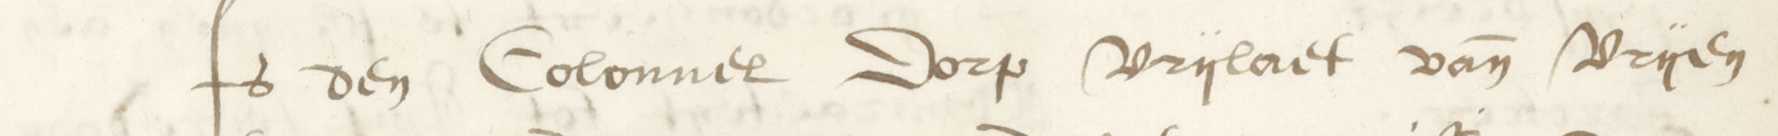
Is den Colonnel Dorp Vrijlaet van Vrijen
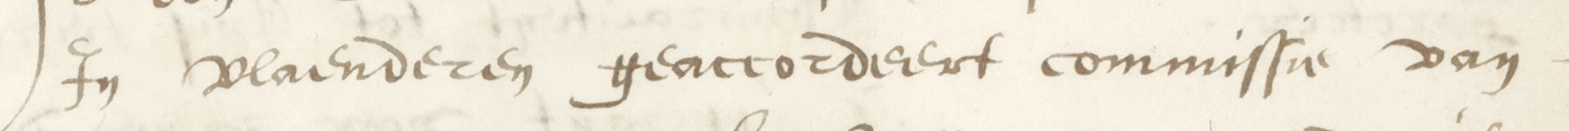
In Vlaenderen geaccordeert commissie van
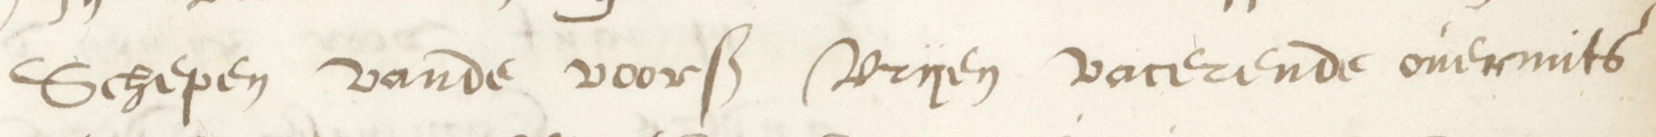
Schepen vande voors Vrijen vacerende ouermits
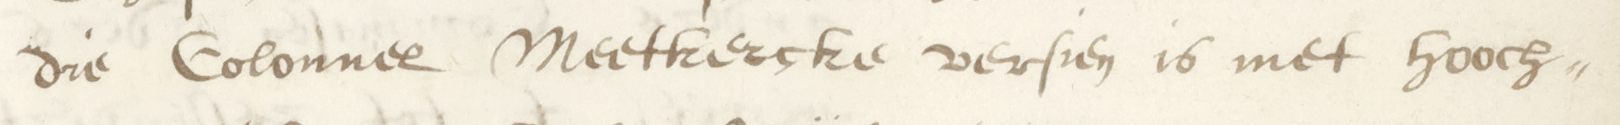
die Colonnel Meetkercke versien is met hooch,,
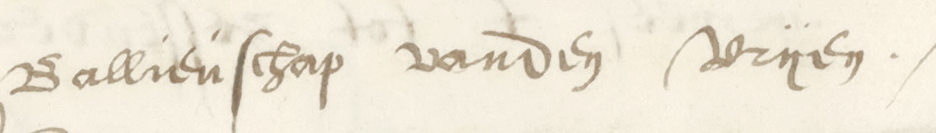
„Ballieuschap vanden Vrijen.
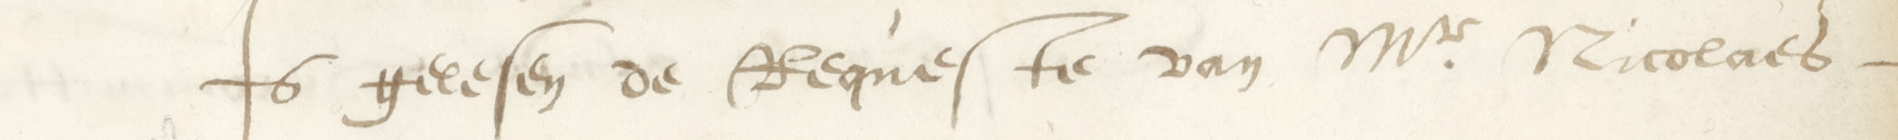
Is gelesen de Requeste van Mr. Nicolaes
